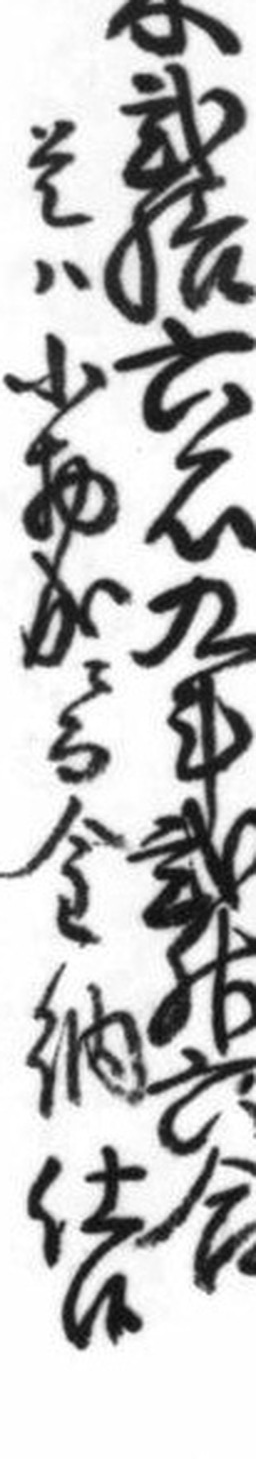是ハ小物成ニ而金納仕候
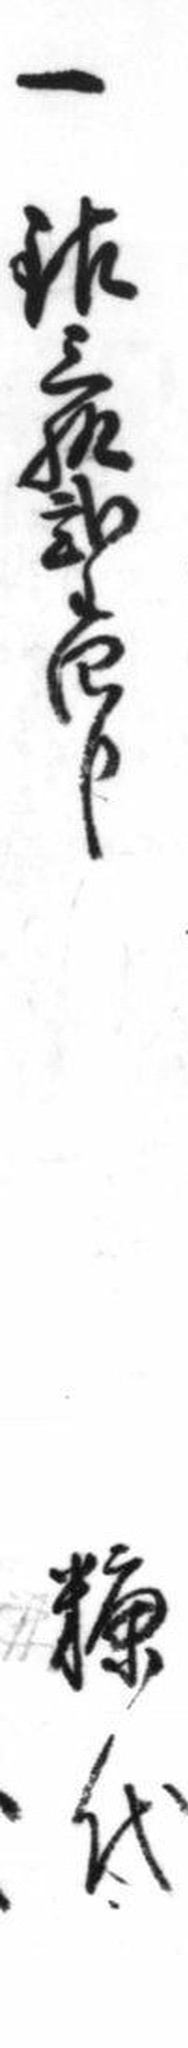一銀三拾弐匁四分糠代
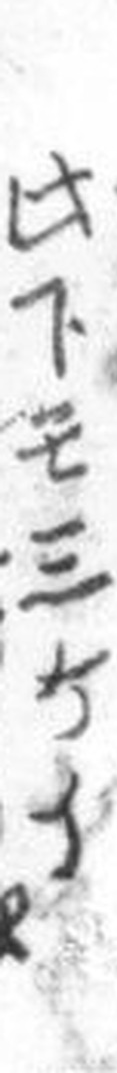此下モ三ケ
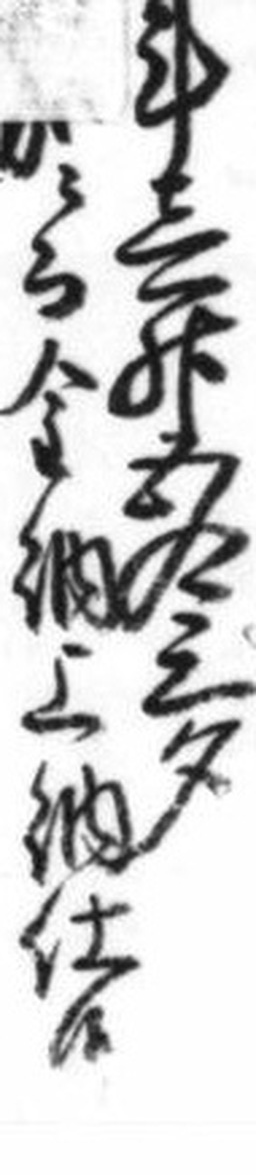ニ而金納上納仕候
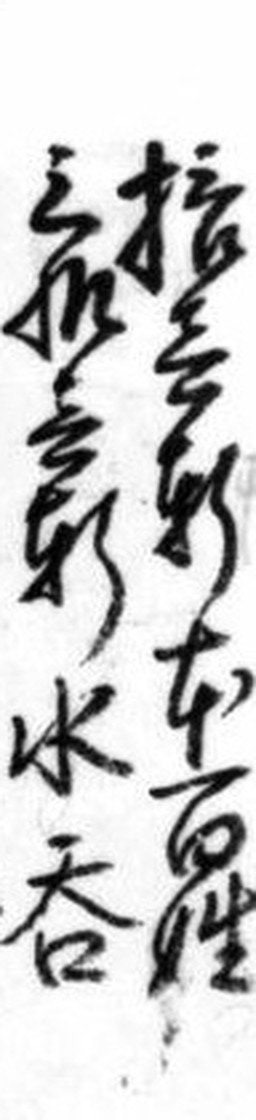三拾壱軒水呑
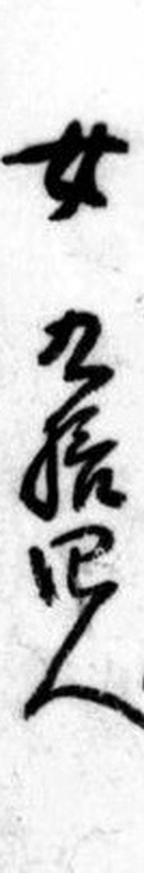女九拾四人

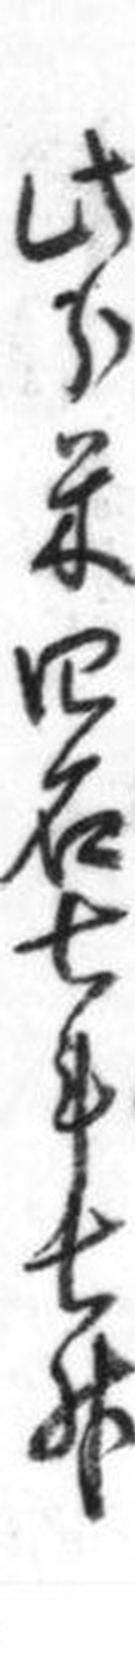此分米四石七斗七升
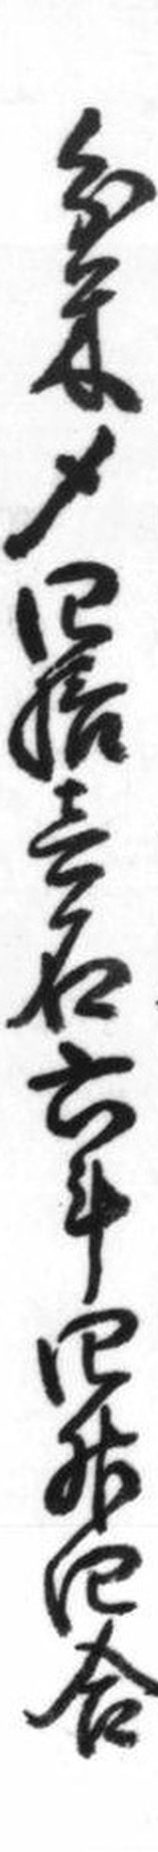分米〆四拾壱石六斗四升四合
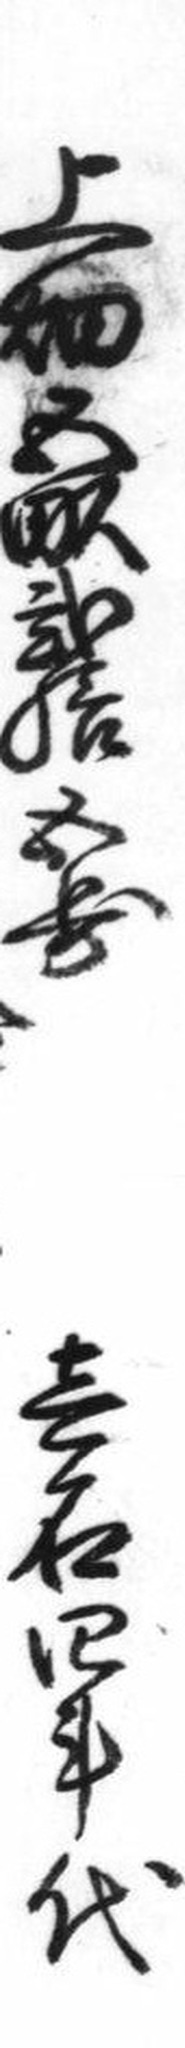上畑五畝弐拾五歩壱石四斗代
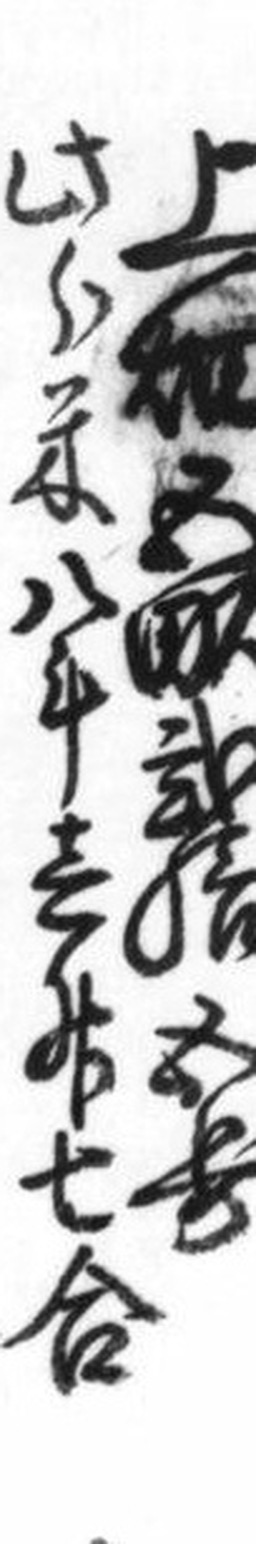此分米八斗壱升七合
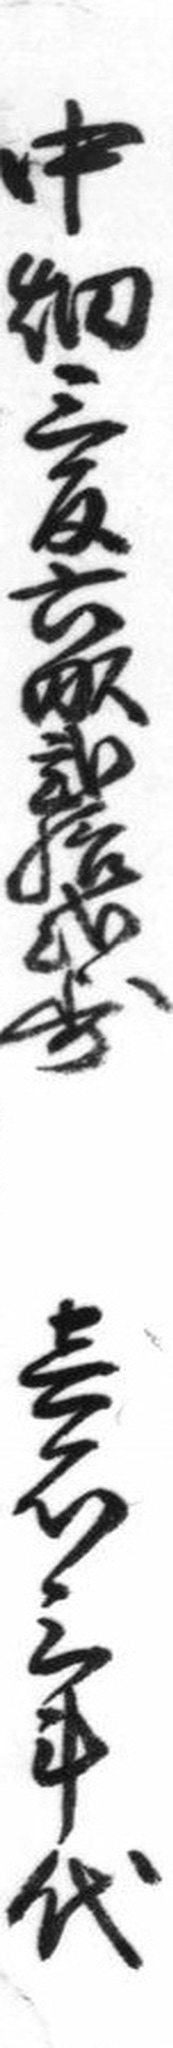中畑三反六畝弐拾弐歩壱石三斗代
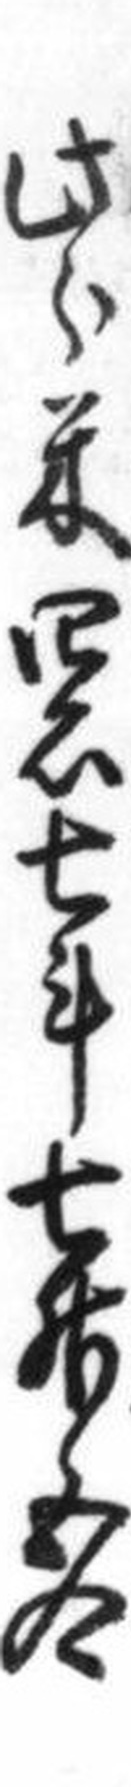此分米四石七斗七升五合
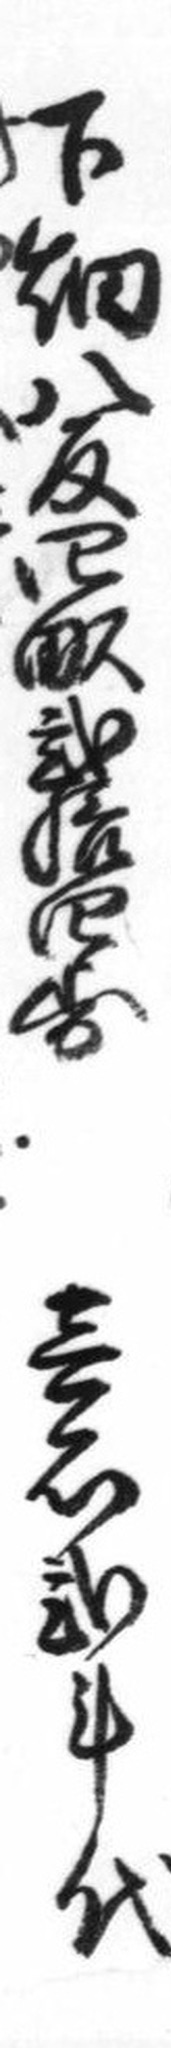下畑八反四畝弐拾四歩壱石弐斗代
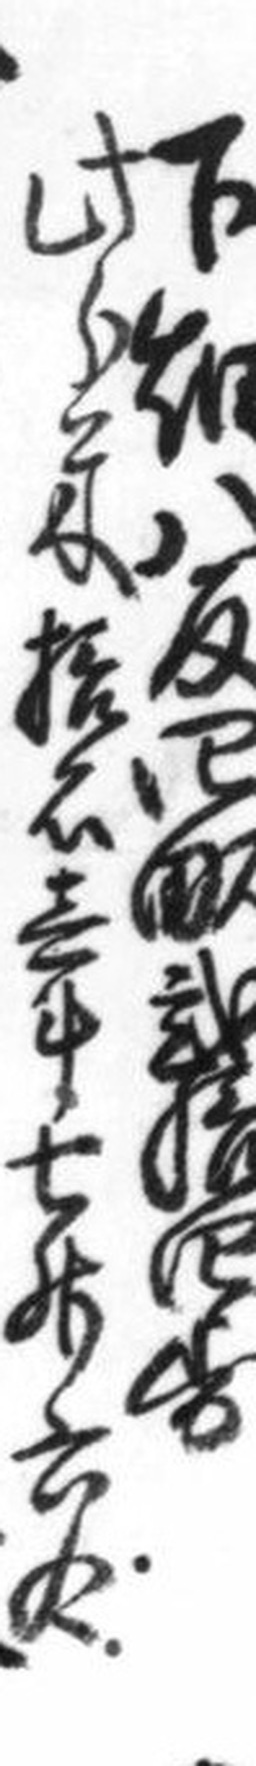此分米拾石壱斗七升六合
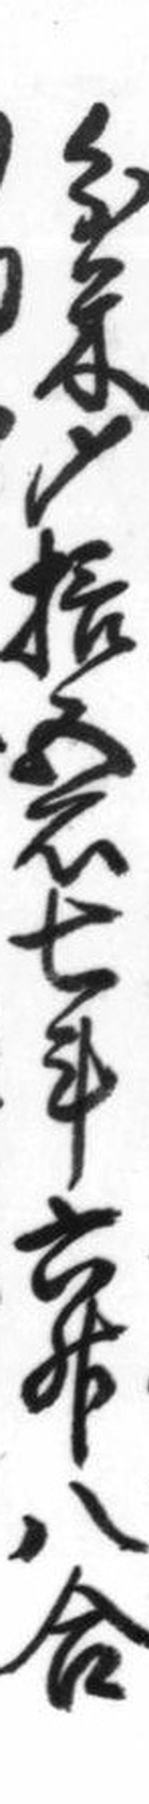分米〆拾五石七斗六升八合
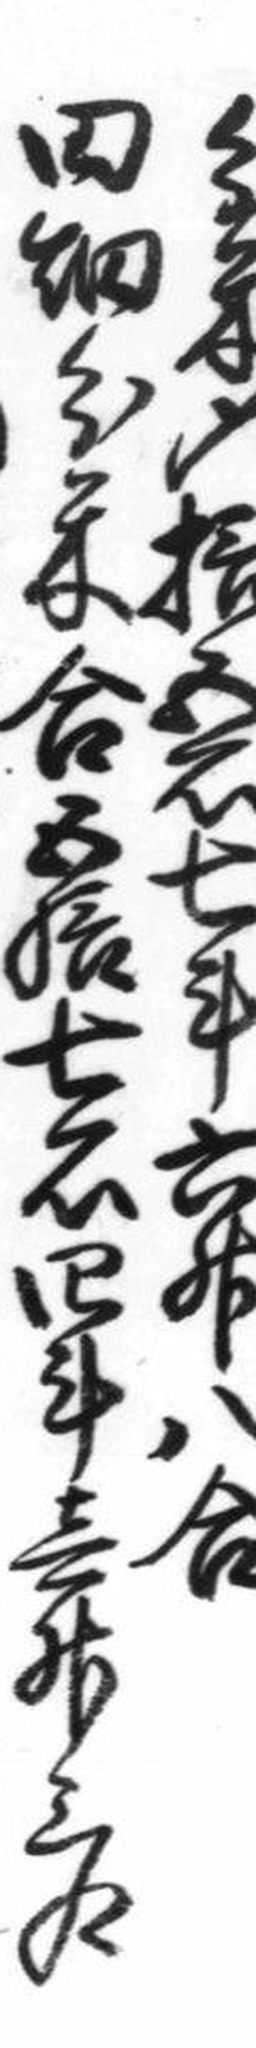田畑分米合五拾七石四斗三升三合
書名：越前国大野郡今井村明細帳
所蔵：福井県文書館 Fukui Prefectural Archives
